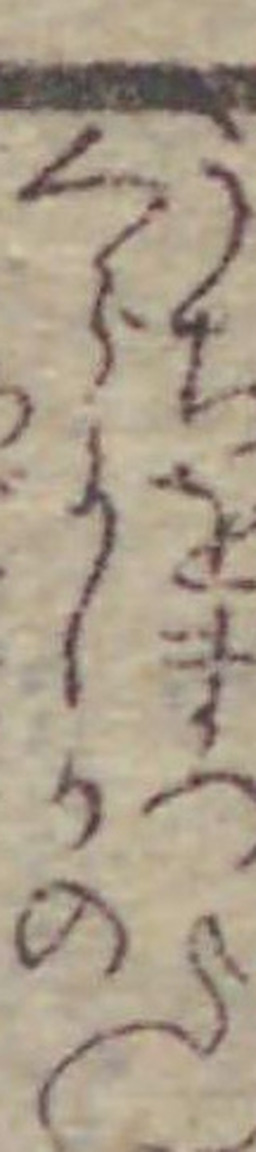くらにしかの
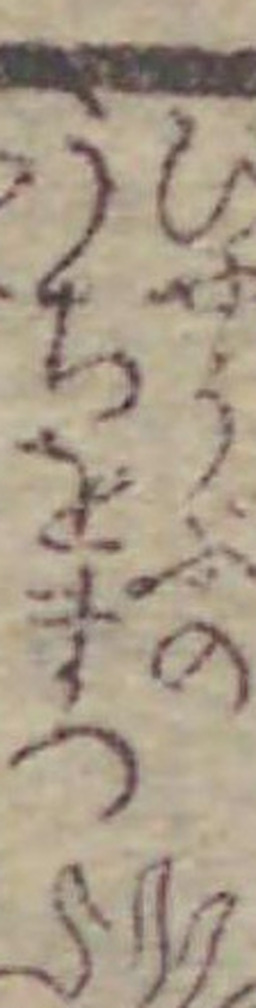うちをまつ
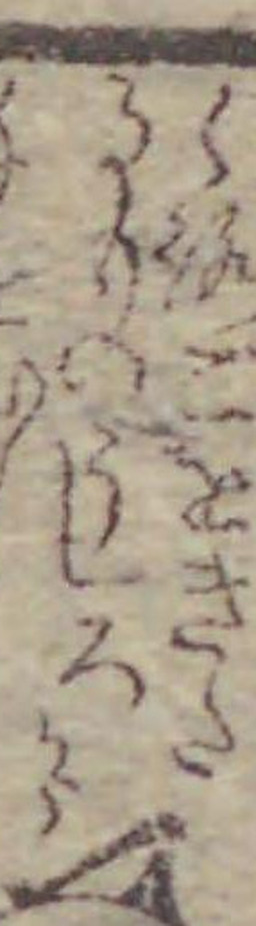るものうしろから
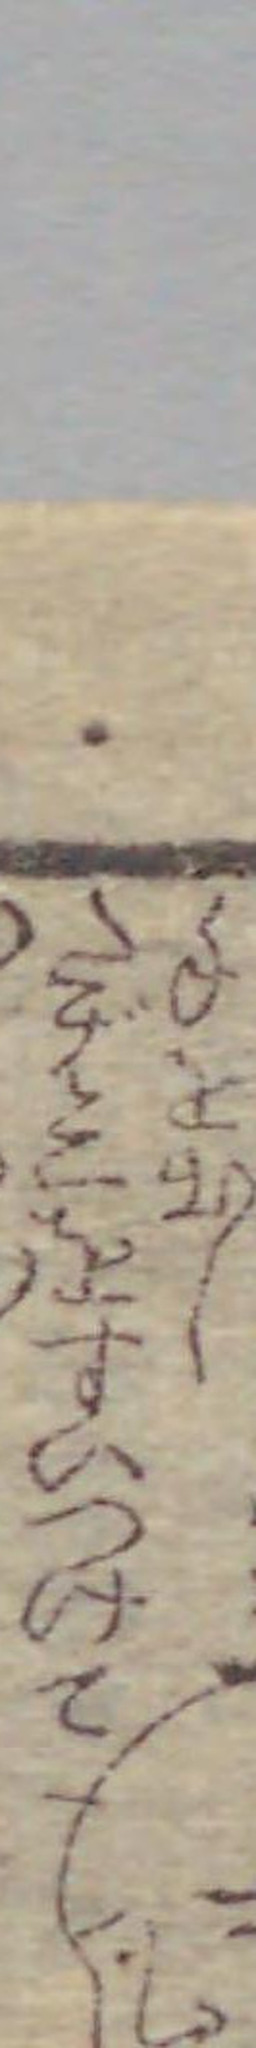たばこをすいつけて
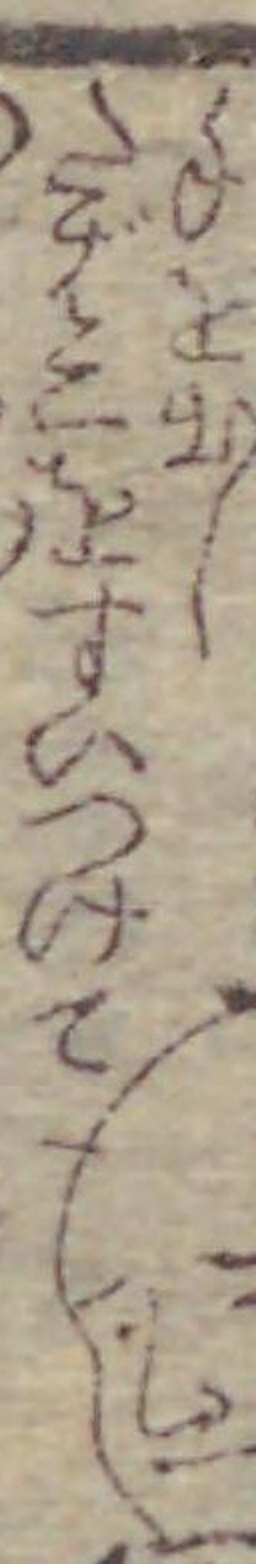たばこをすいつけて
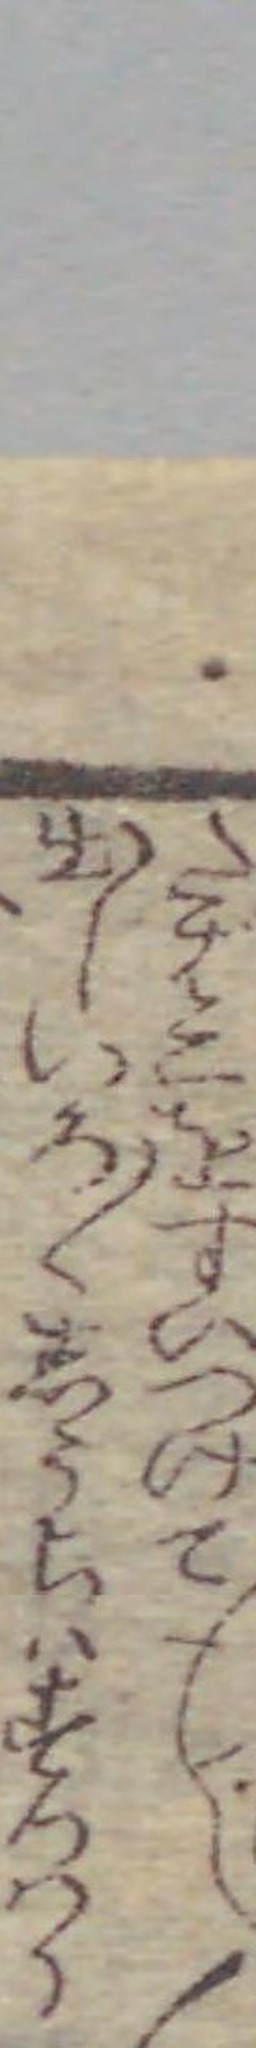出しいろ〳〵しうちはすつはり
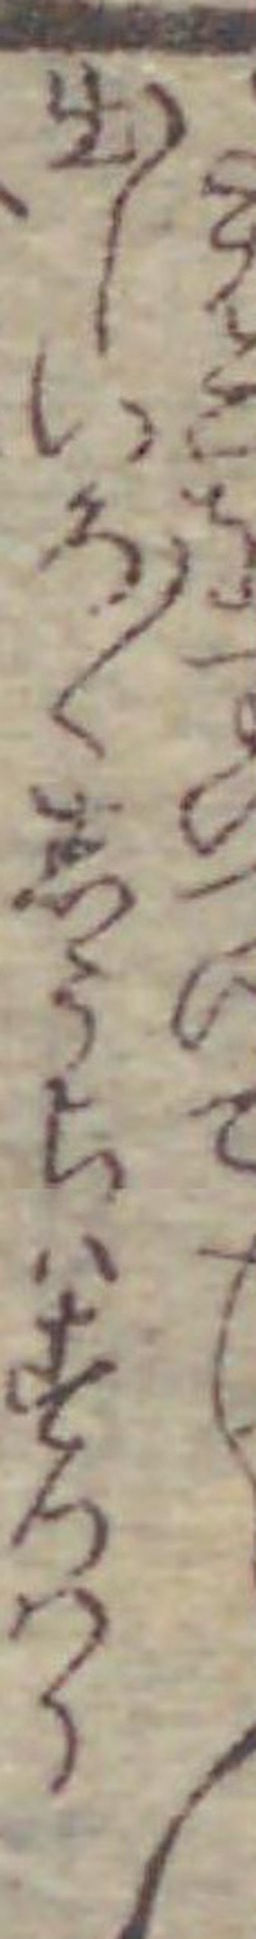出しいろ〳〵しうちはすつはり
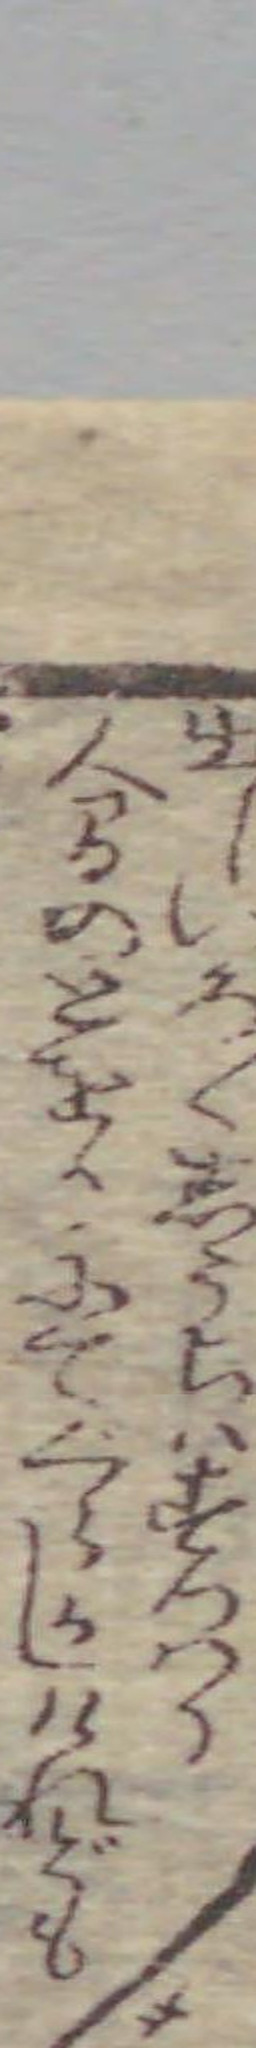人間のとをりにてぐらかしけれども
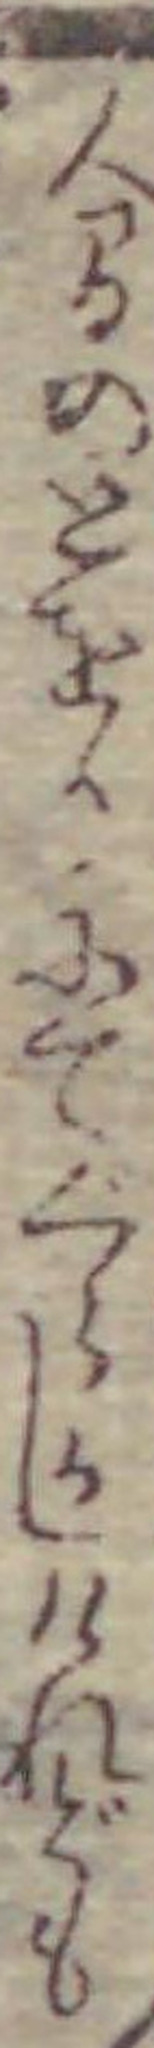人間のとをりにてぐらかしけれども
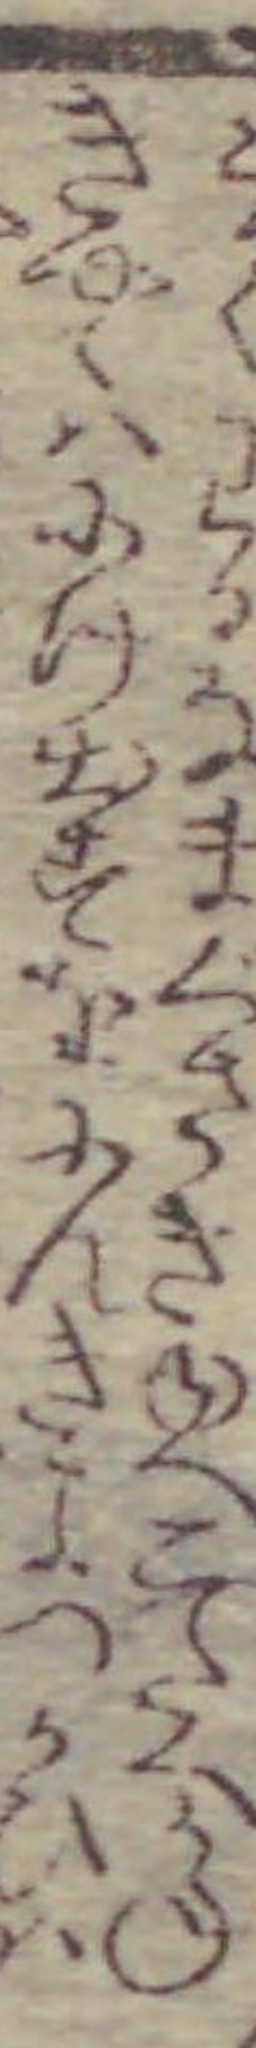きやくはにけ出すをにんきよつかひは
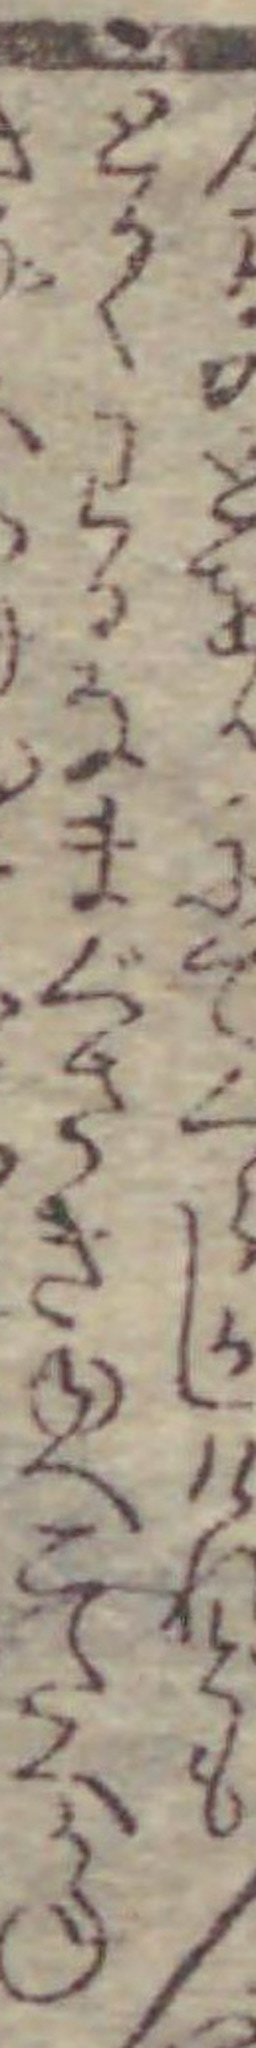とかくわるなまぐさきゆへこたへかね
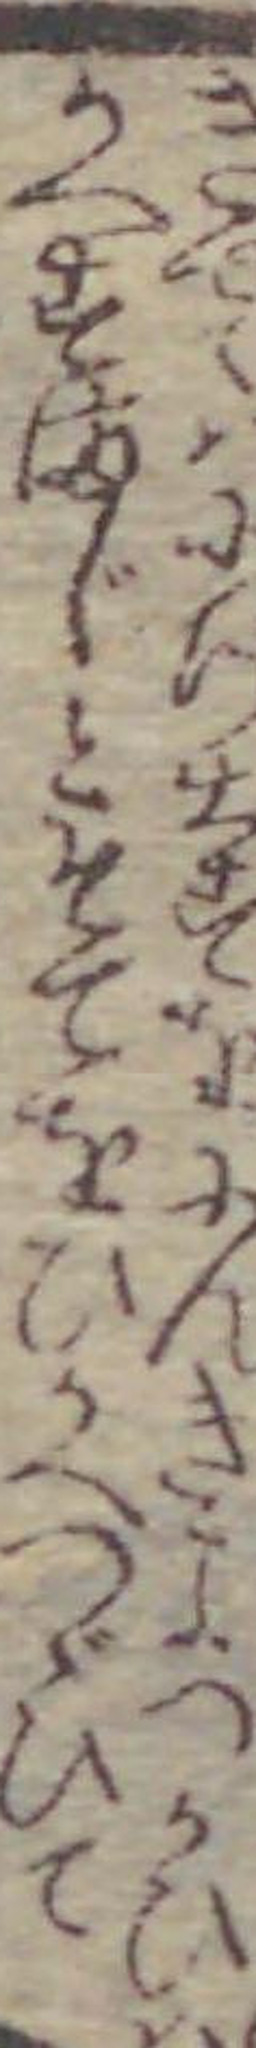かへすまじとそてをひかへつゞひて
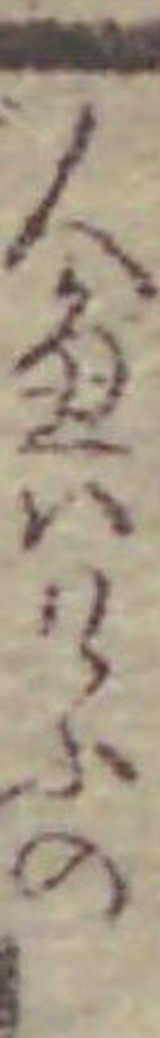人魚はけふの
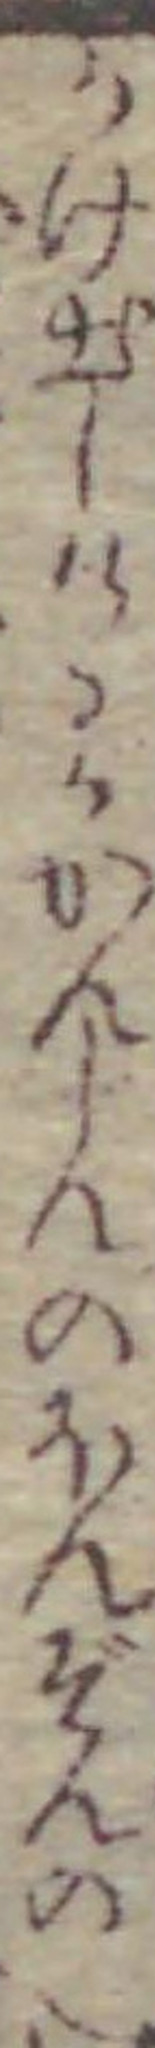かけ出しけるかかんじんのほんぞんの
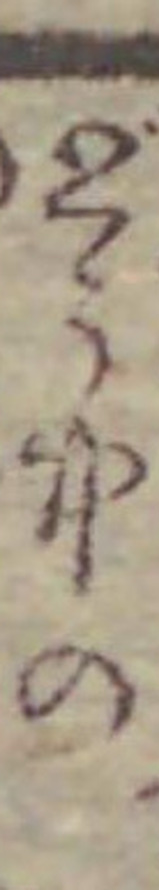とう中の
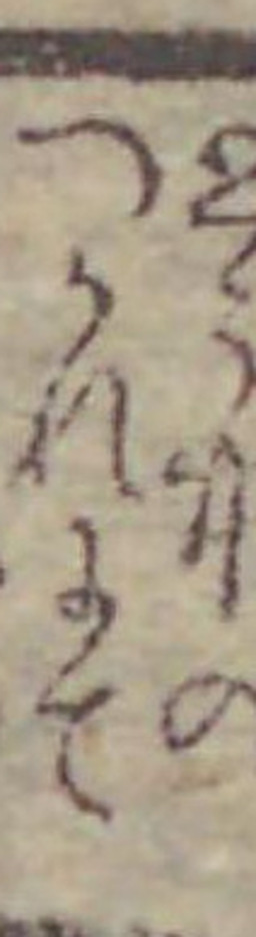つかれにて
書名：箱入娘面屋人魚 3巻
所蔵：国立国会図書館 National Diet Library, JAPAN
